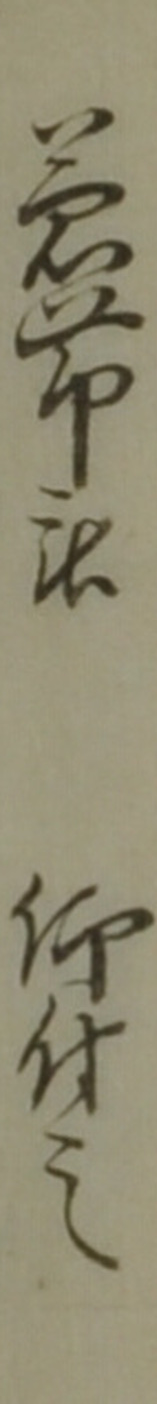兼帯被仰付之
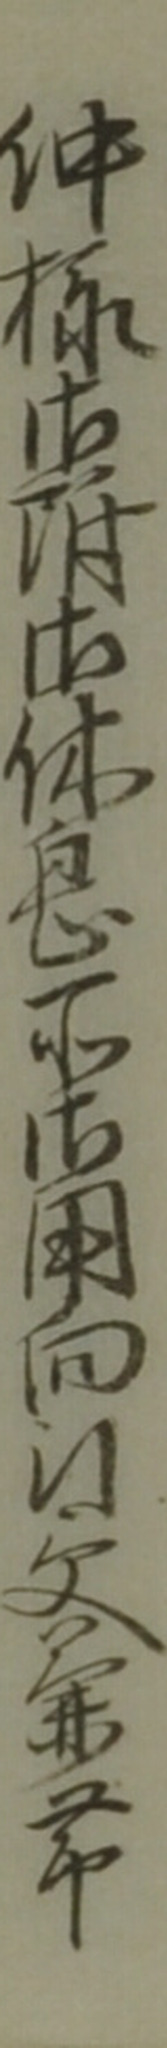仲様御附御休息所御用向引受兼帯
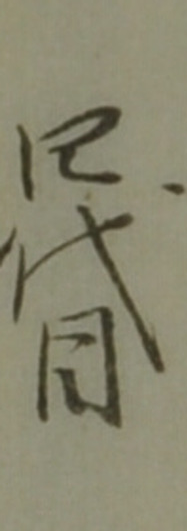四代目
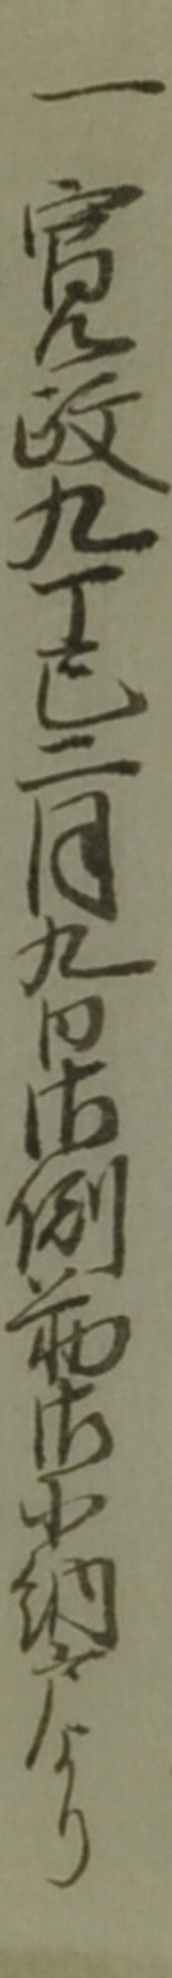一寛政九丁巳二月九日御側勤御小納戸より
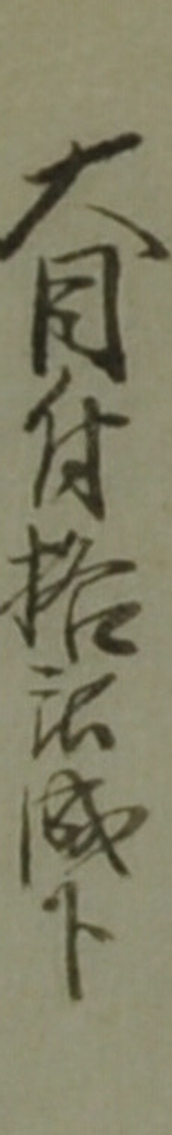大目付格被成下
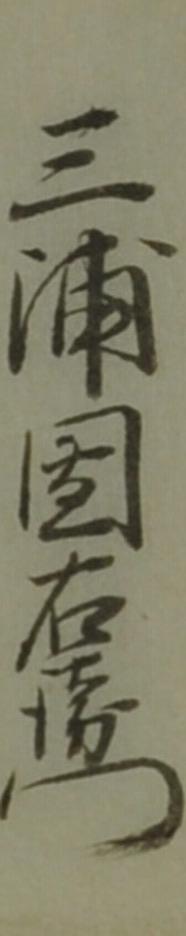三浦団右衛門
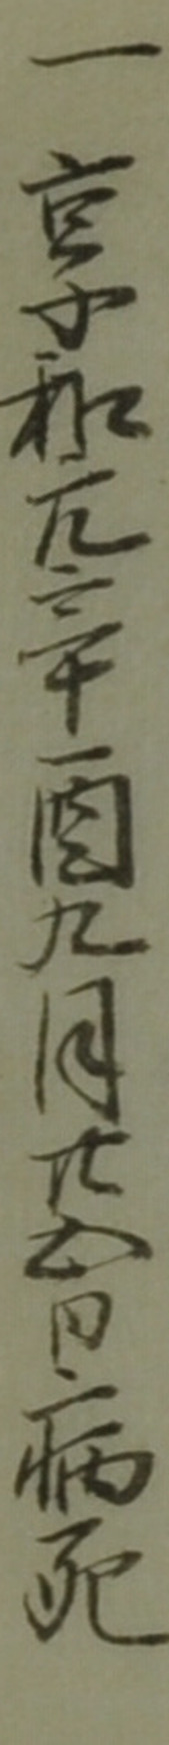一享和元辛酉九月廿五日病死
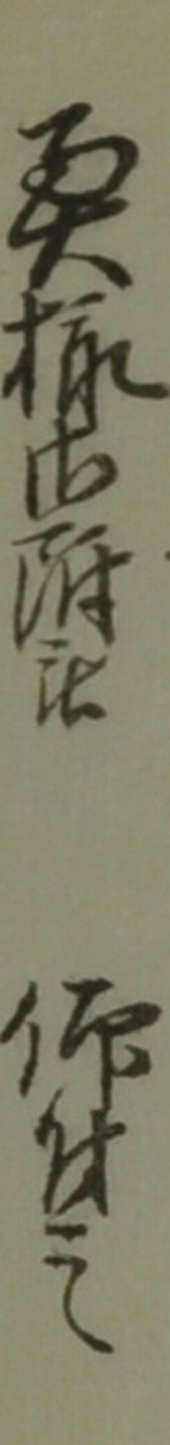奥様御附被仰付之
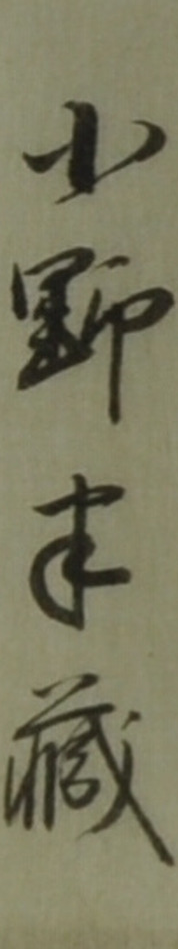小野半蔵
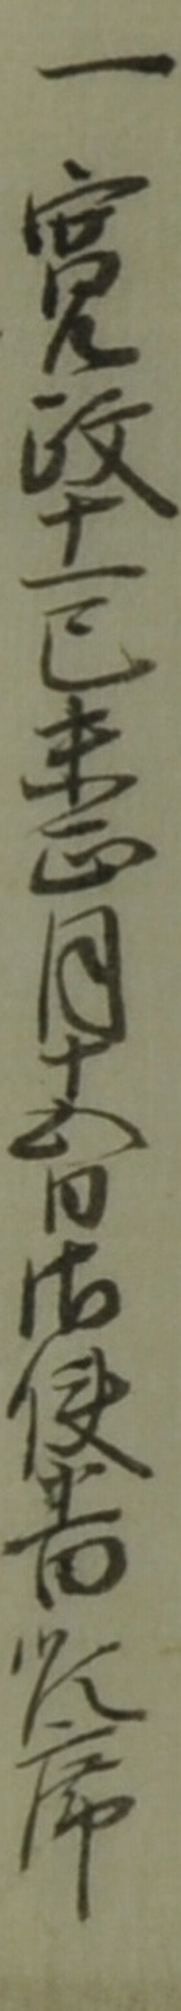一寛政十一己未正月十五日御使番順席
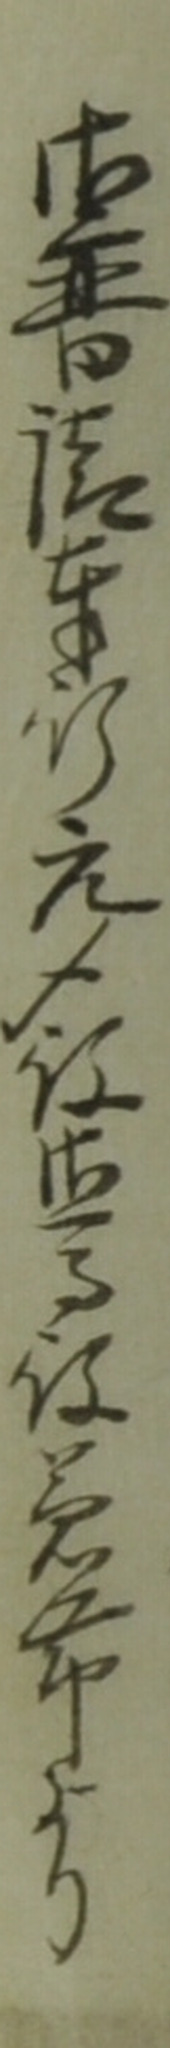御普請奉行元〆役御馬役兼帯より

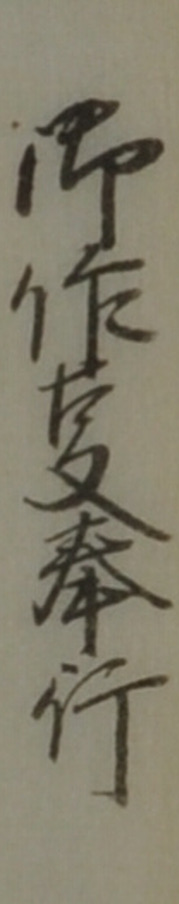御作事奉行
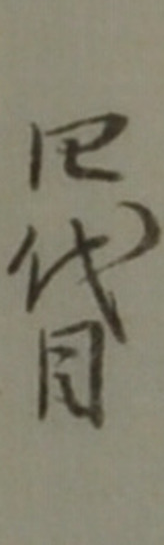四代目
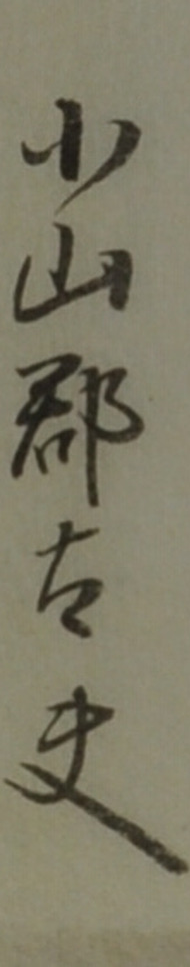小山郡太夫
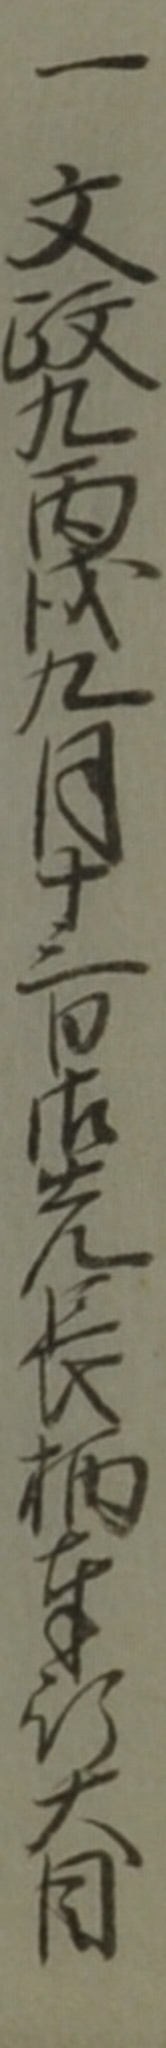一文政九丙戌九月十三日御先長柄奉行大目
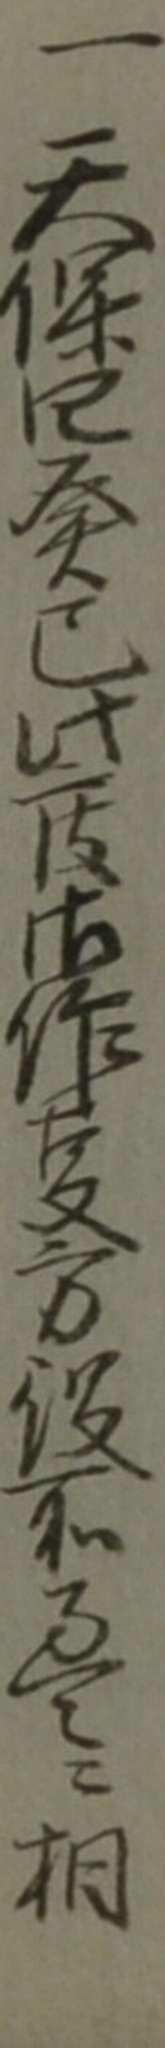一天保四癸巳此度御作事方役所◻︎ニ相
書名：諸御役代々録（六）
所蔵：伊那市立高遠町図書館・合同会社AMANE
